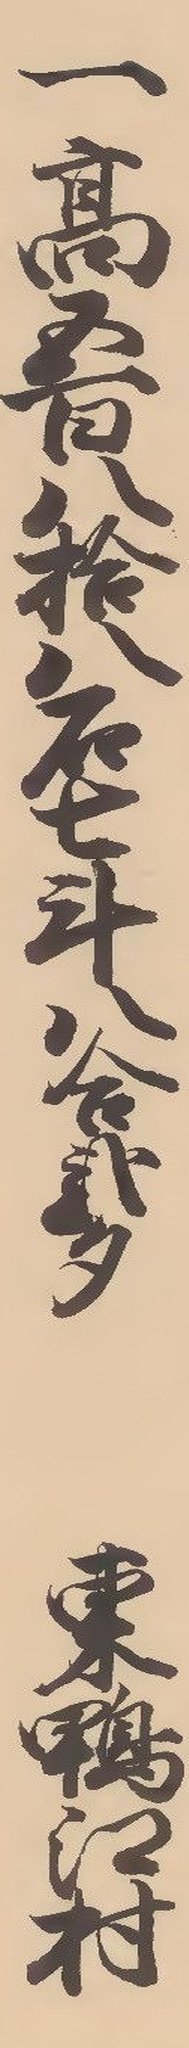一高五百八拾八石七斗八合弐勺東鴨江村
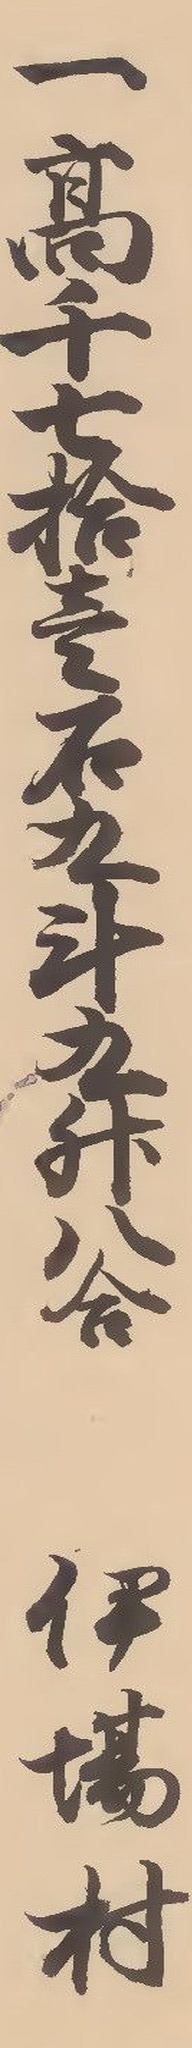一高千七拾壱石九斗九升八合伊場村
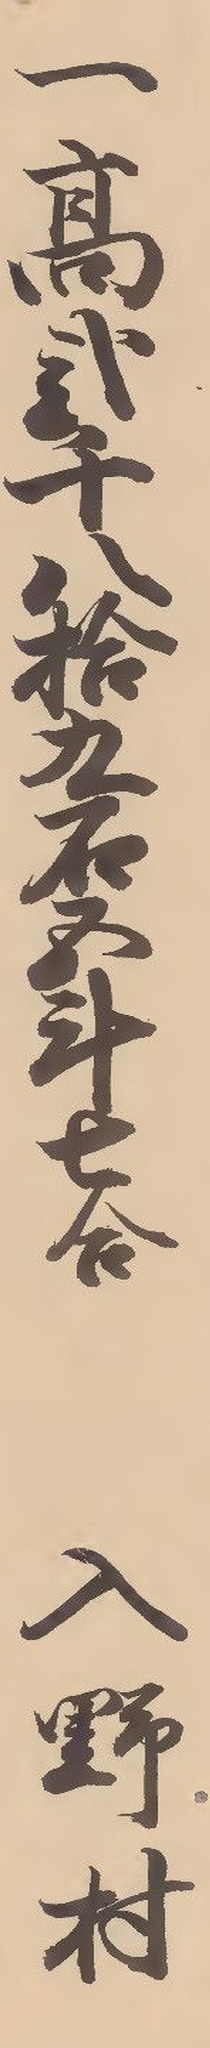一高弐千八拾九石五斗七合入野村
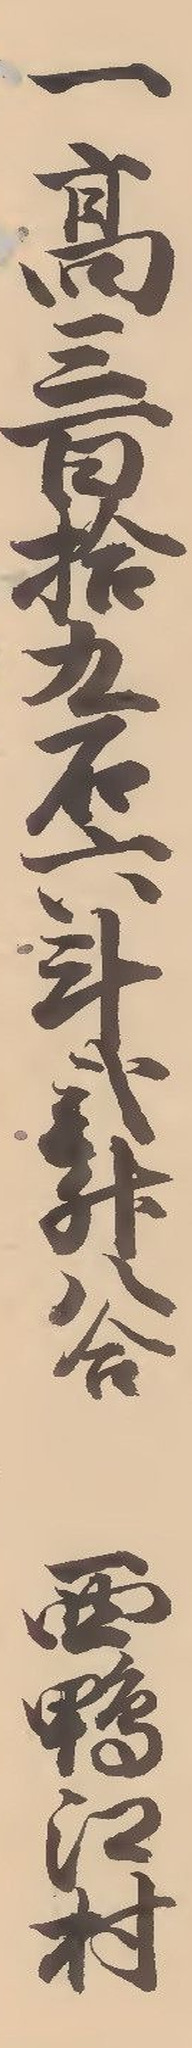一高三百拾九石六斗弐升八合西鴨江村

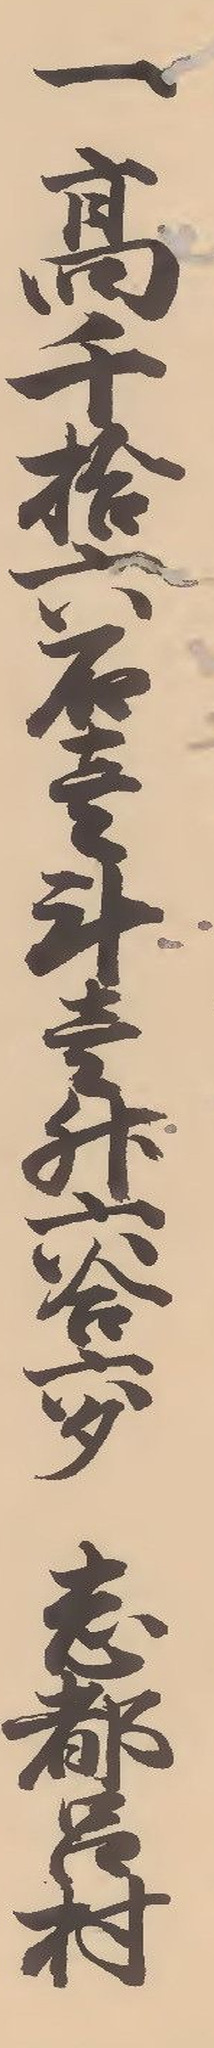一高千拾六石壱斗壱升六合六勺志都呂村
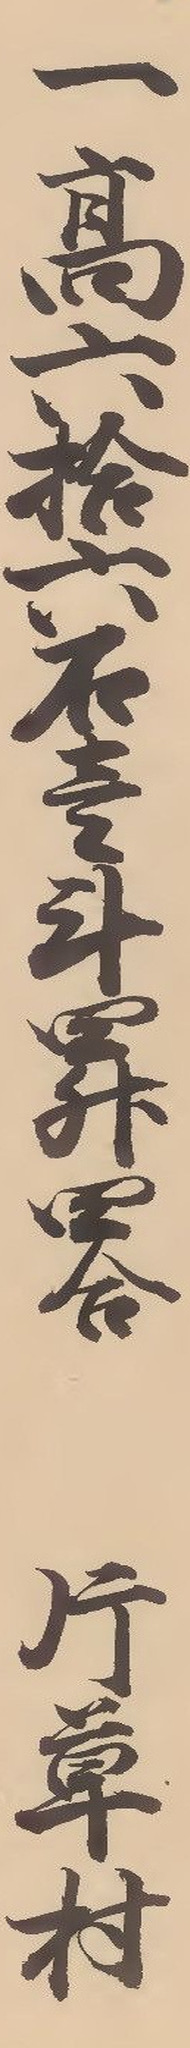一高六拾六石壱斗四升四合片草村
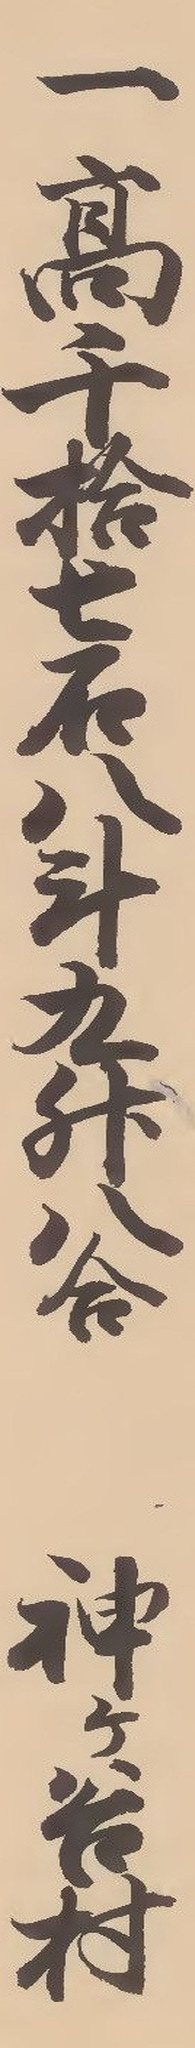一高千拾七石八斗九升八合神ヶ谷村
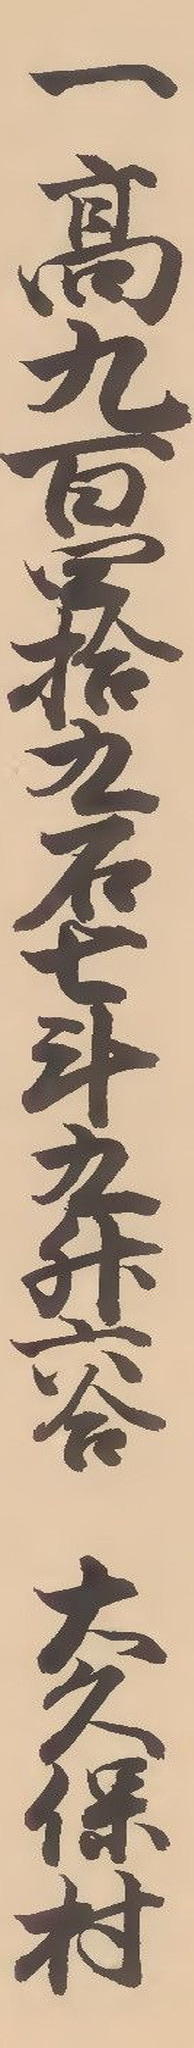一高九百四拾九石七斗九升六合大久保村
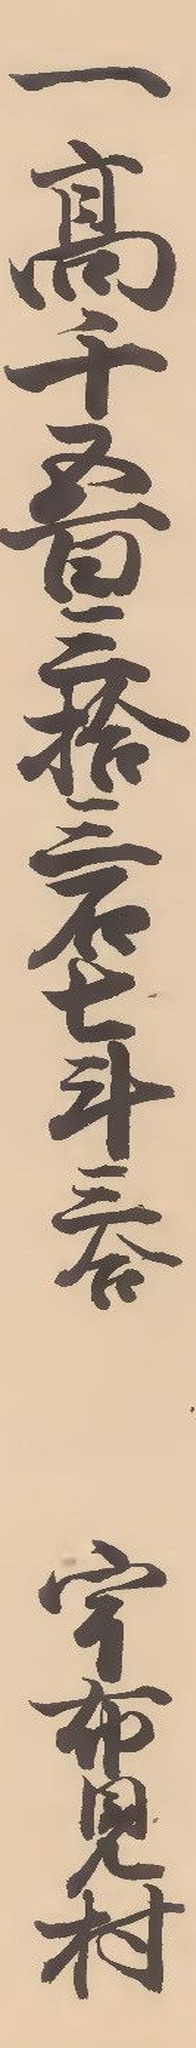一高千五百三拾三石七斗三合宇布見村
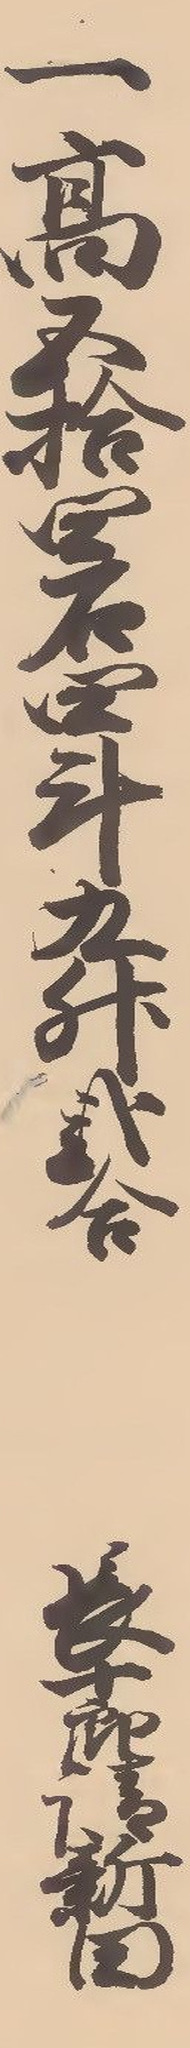一高五拾四石四斗九升弐合長十郎請新田
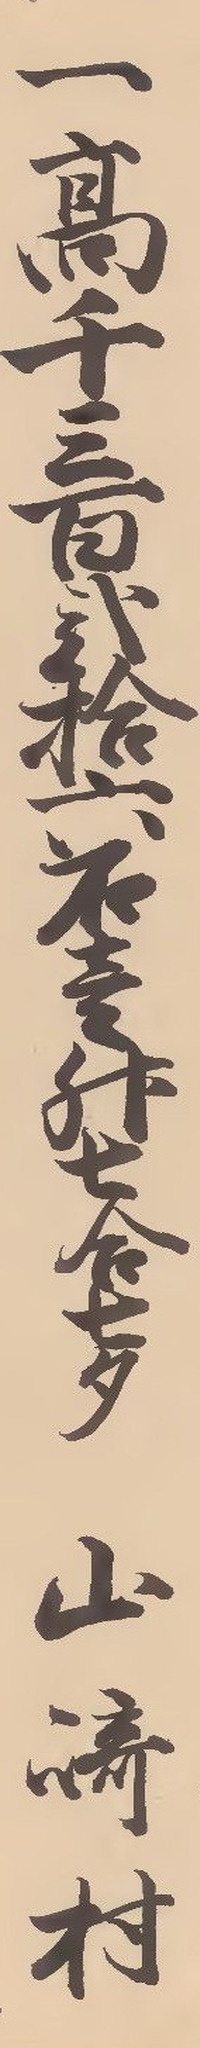一高千三百弐拾六石壱升七合七勺山崎村
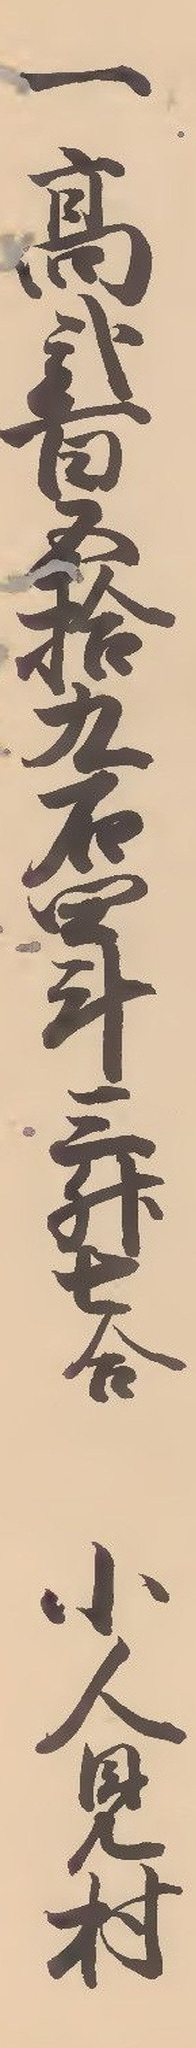一高弐百五拾九石四斗三升七合小人見村

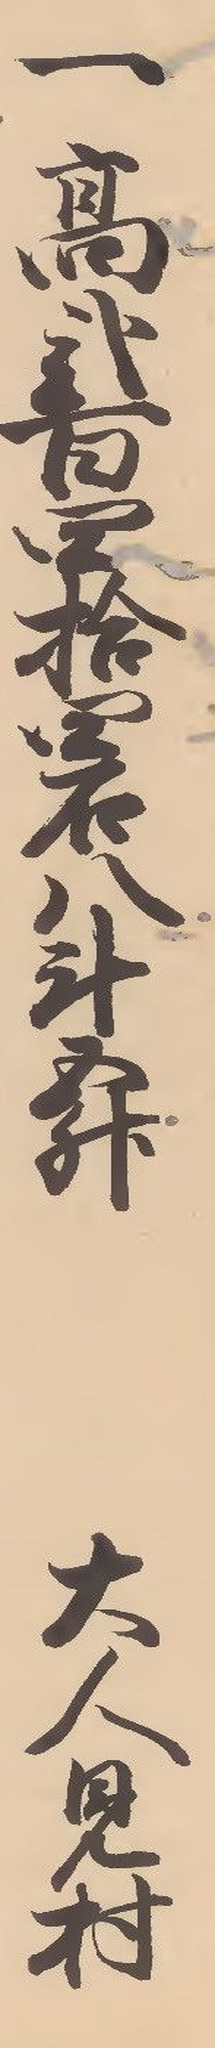一高弐百四拾四石八斗五升大人見村
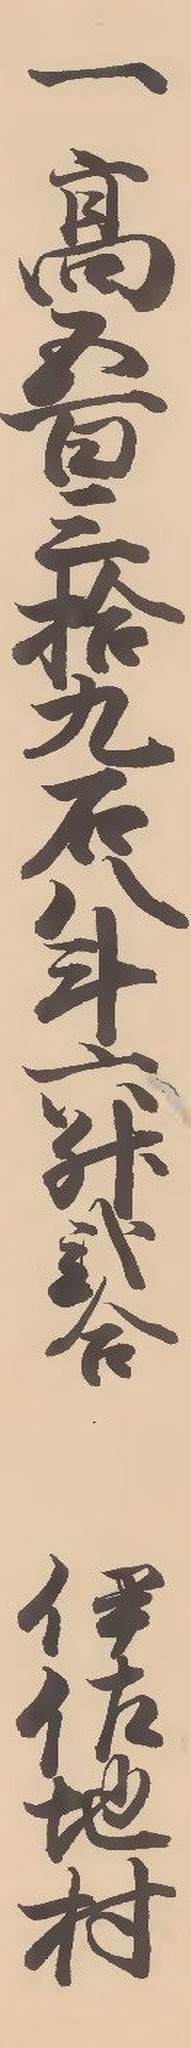一高五百三拾九石八斗六升弐合伊佐地村
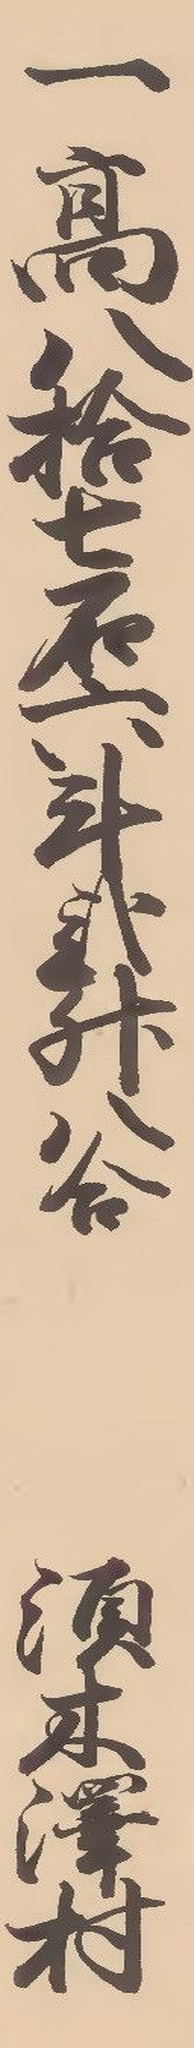一高八拾七石六斗弐升八合須木沢村
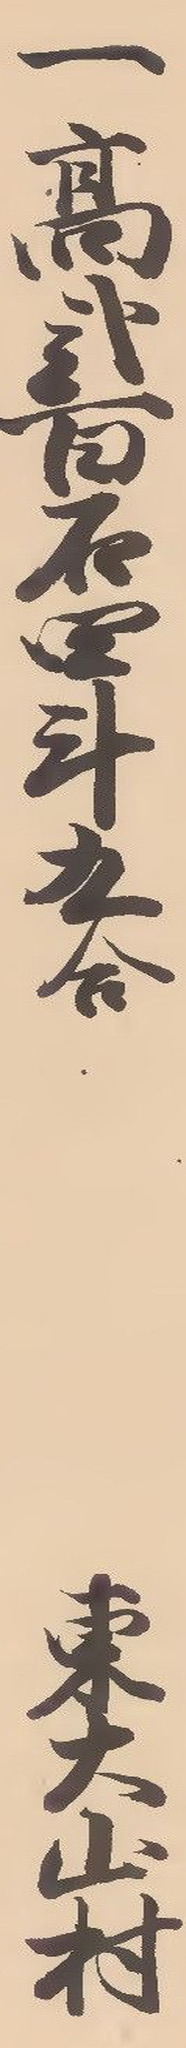一高弐百石四斗九合東大山村
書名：遠江国郷帳
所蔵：国立公文書館 National Archives of Japan
